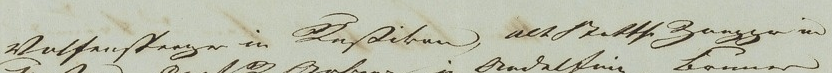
Wolfensperger in Rußikon, Alt Statth Zangger in
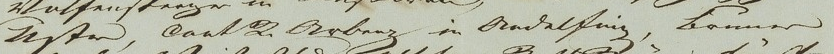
Uster, CantR. Arbenz in Andelfingen, Brunner-
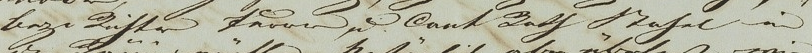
Bez. Richter Furrer u. Cant.Rath Stahel in
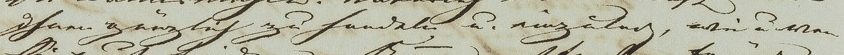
Ihnen gänzlich zu handeln u. einzuladen, wie u. wen
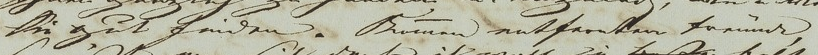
Sie gut finden. Kommen entferntere Freunde,
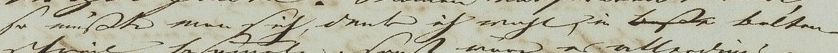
so müßte man sich, denk ich wohl, in Balten-
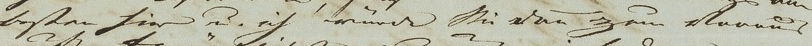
besten hier u. ich würde Sie dann zum Voraus
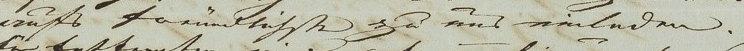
aufs Freundlichste zu uns einladen. –
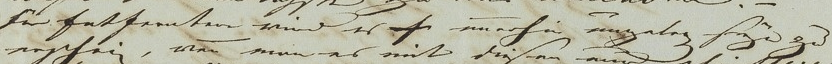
Für Entferntere wird es s immerhin ungelegen seyn zu
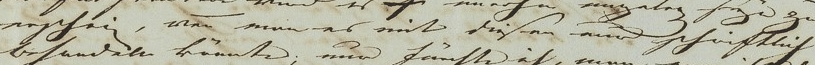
erscheinen, wenn man es mit diesen nur schriftlich
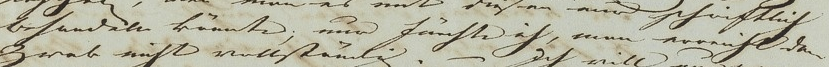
behandeln könnte; nur fürchte ich, man erreicht den
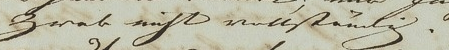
Zwek nicht vollständig. –
